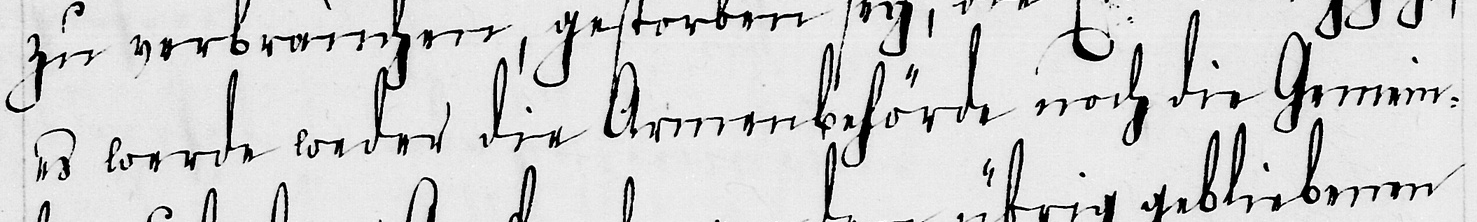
es werde weder die Armenbehörde noch die Gemein¬
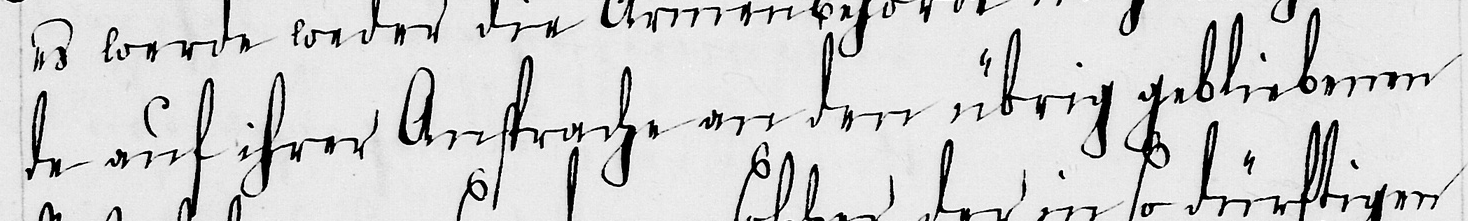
de auf ihrer Ansprache an den übrig gebliebenen
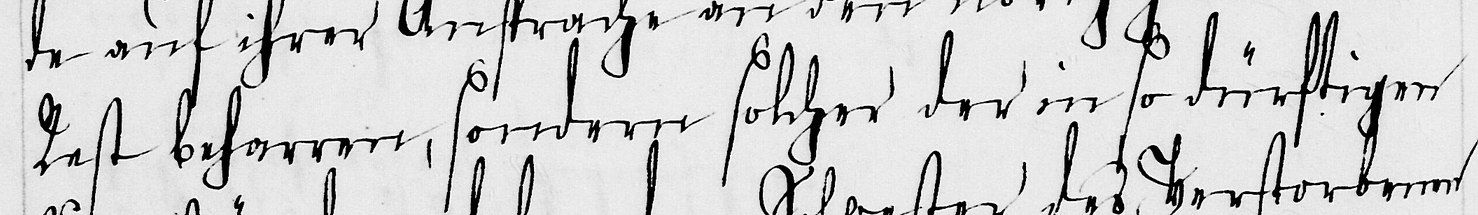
Rest beharren, sondern solcher der in so dürftigen
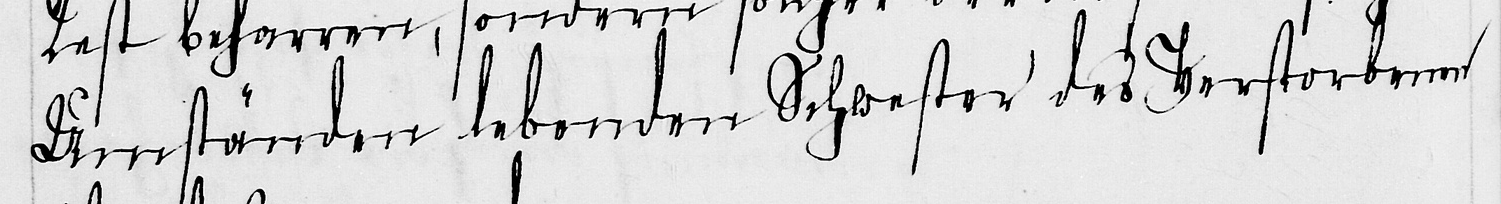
Umständen lebenden Schwester des Verstorbenen
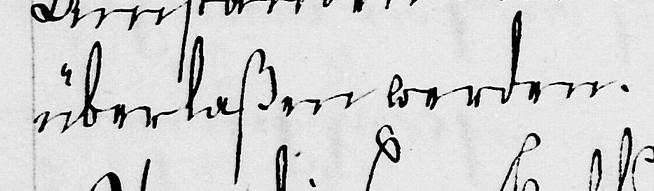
überlaßen werden.
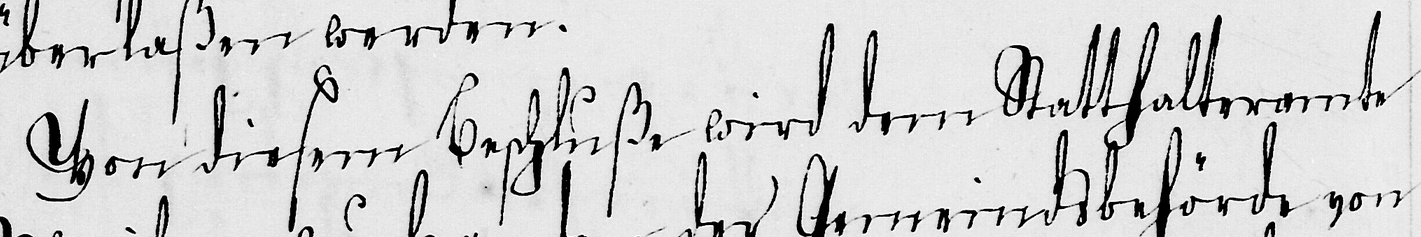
Von diesem Beschluße wird dem Statthalteramte
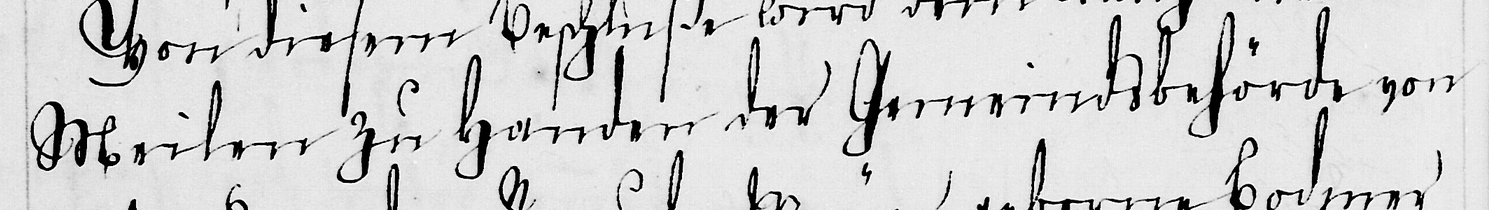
Meilen zu Handen der Gemeindsbehörde von
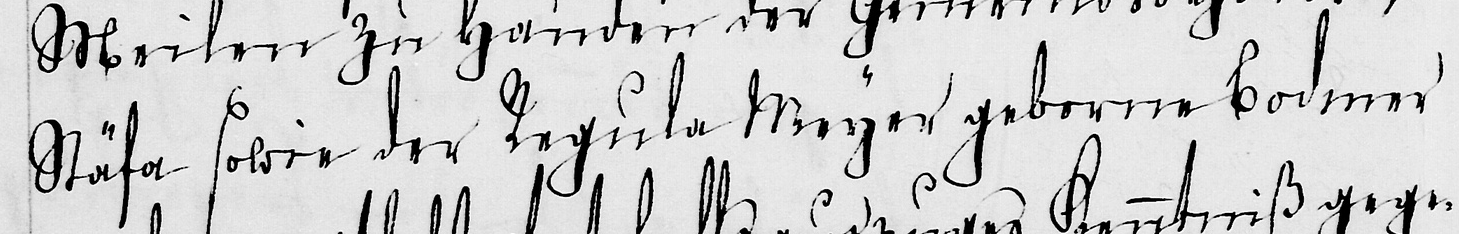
Stäfa sowie der Regula Meyer geborne Bodmer
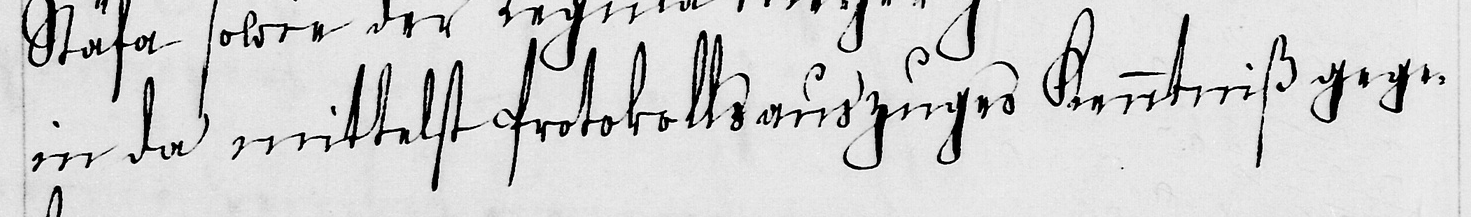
in da mittelst Protokollsauszuges Kenntniß gege¬
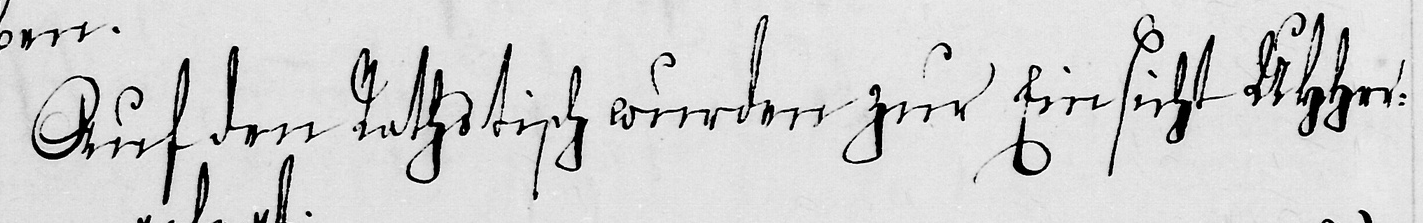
Auf den Rathstisch wurden zur Einsicht UHHer¬
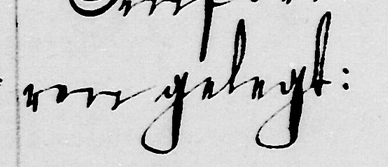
ren gelegt:
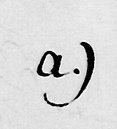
a.)
